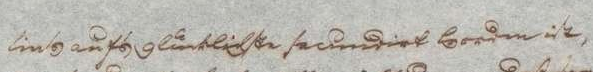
lin's auf's glücklichste secundirt worden ist,
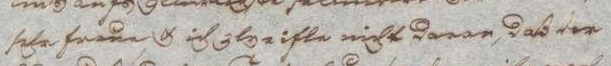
sehr freue, & ich zweifle nicht daran, daß der
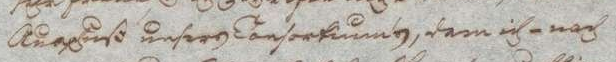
Ausschuß unsers Consortium's, dem ich – nach
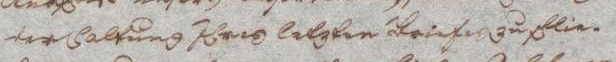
der Haltung Ihres letzten Briefes zu schlie-
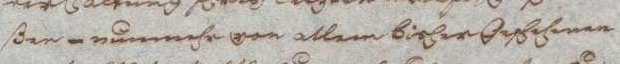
ßen – nunmehr von allem bisher Geschehenen
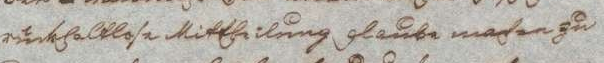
rückhaltlose Mittheilung glaube machen zu
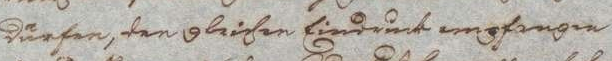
dürfen, den gleichen Eindruck empfangen
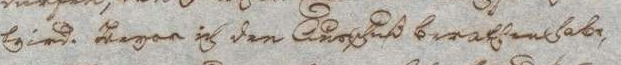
wird. Bevor ich den Ausschuß berathen habe,
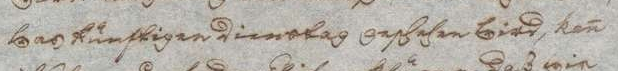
was künftigen Dienstag geschehen wird, kann
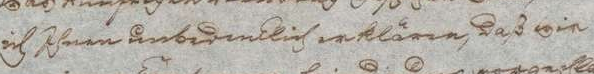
ich Ihnen unbedenklich erklären, daß wir
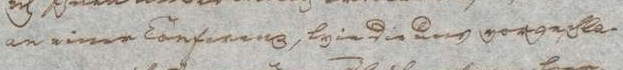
an einer Conferenz, wie die uns vorgeschla-
